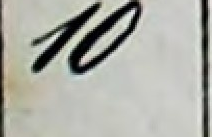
10
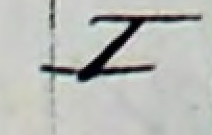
I
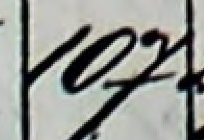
107
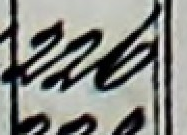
226
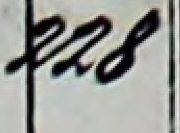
228
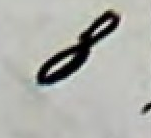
8
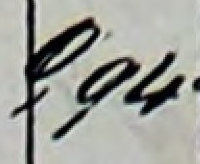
0,94
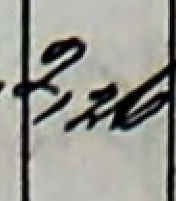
2,26
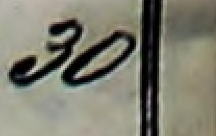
30
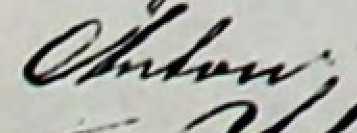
Anton
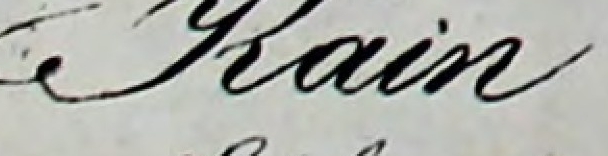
Kain
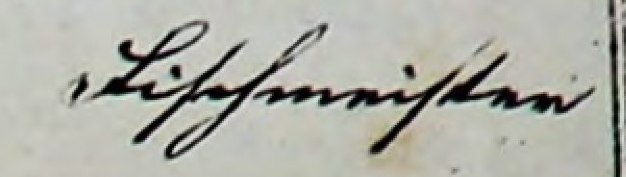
Fischmeister
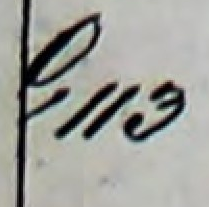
0,113
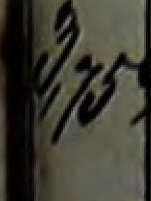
3,75
